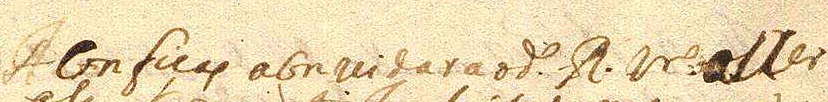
A Confiçaꝭ a conuidara o d.o R. vr.o a Uer
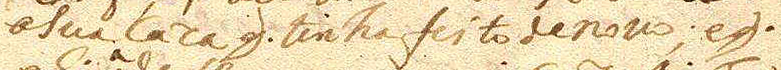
a sua caza q̄. tinha feito de novo; e q̄.
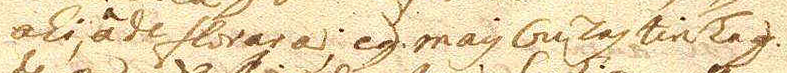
ahi, a deflorara; e q̄ mais couzas tinha q̄.
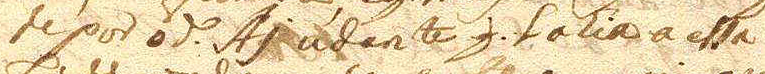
depor o d.o Ajudante q̄. la hia a essa
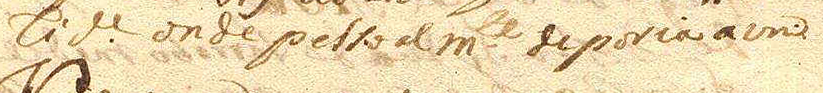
Cid.e onde pessoalm.te deporia a vm
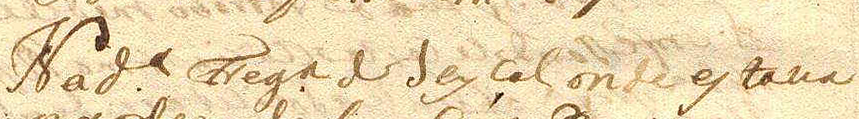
Na d.a Freg.a do Seyçal onde estaua
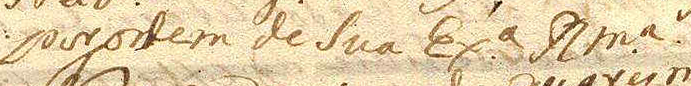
por ordem de Sua Ex.a Rm.a
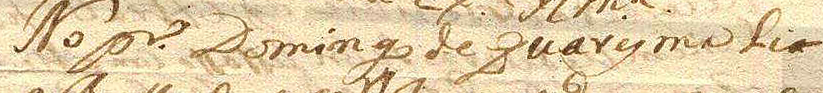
No p.ro Domingo de quaresma lia
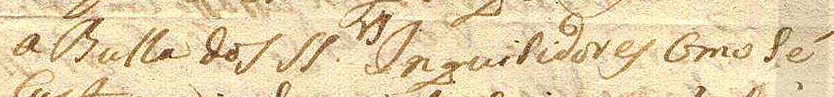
a Bulla dos ss.rs Inquisidores Como se
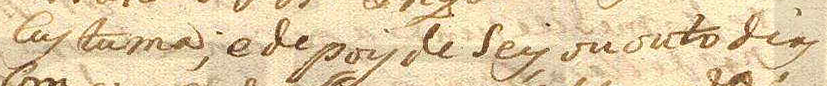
custuma; e depois de seis, ou outo dias
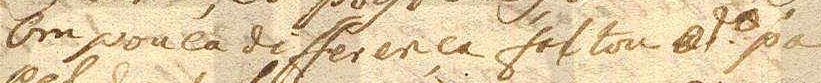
com pouca differença faltou o d.o pa
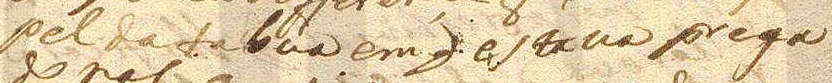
pel da tabua em q̄. estaua prega
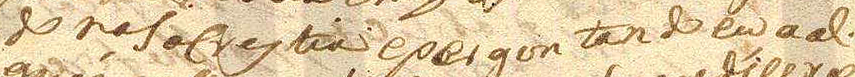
do na saCrestia, e perguntando eu a al
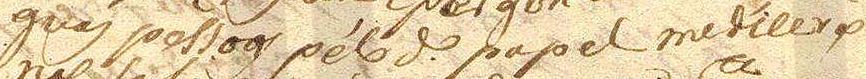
guās pessoas pelo d.o papel me diceraꝭ
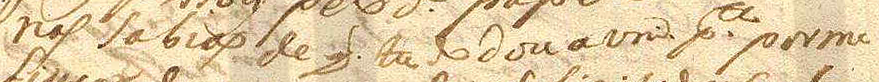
naꝭ sabiaꝭ de q̄ tudo dou a vm p.te por me
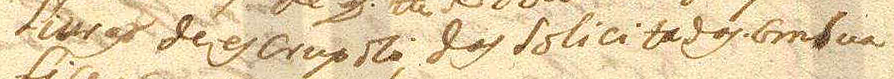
liurar de escrupolo; das solicitadas com sua
